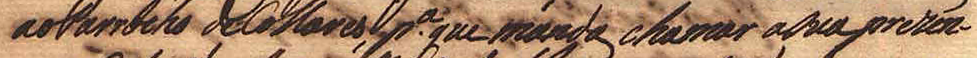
ao Parrocho de Collares, p.a que manda chamar a sua prezen
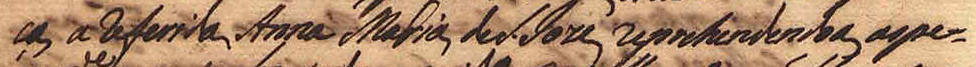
ça, a Referida Anna Maria de S. Ioze, reprehendendoa aspe
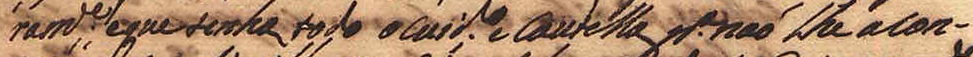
ram.te e que tenha todo o cuid.o e Cautella p.a naõ lhe acon
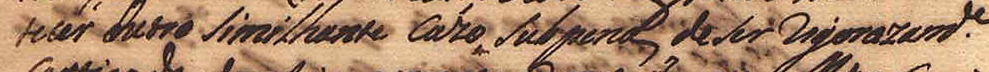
tecer outro similhante cazo, sub pena de ser Rigorozam.te
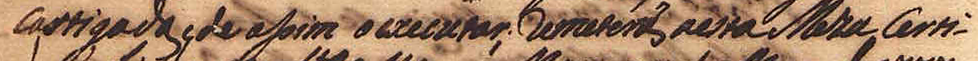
castigada e de assim o executar; Remetera a esta Meza certi
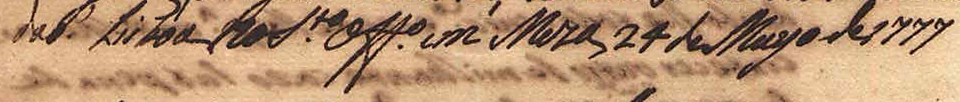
daõ Lisboa no S.to Off.o em Meza, 24 de Mayo de 1777
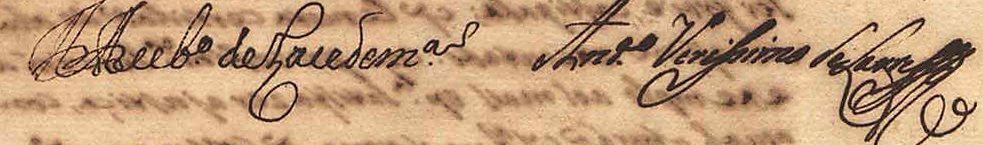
AArceb.o de Lacedema. Ant.o Verissimo de Larre
